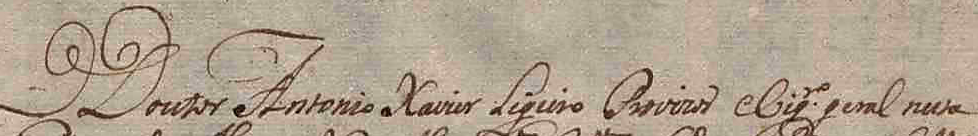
O Doutor Antonio Xavier Ligeiro Provizor, e Vig.ro geral nesta
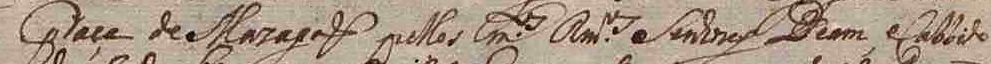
praça de Mazagaõ pellos m.tos Rm.os Senhores Deam, e Cabbido
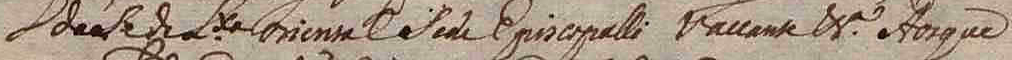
da Se de L.xa oriental Sede Episcopalli vaccante &r.a Aos que
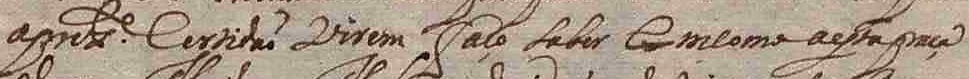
a prez.te Certidaõ virem faço saber Em como a esta praça
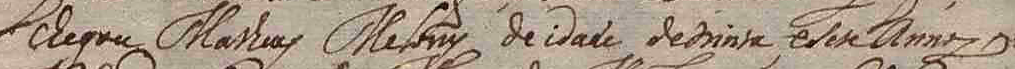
chegou Matheus Melony de idade de trinta, e sete Annos
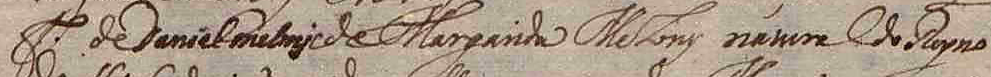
f.o de Daniel melonj e de Margarida MeLony natural do Reyno
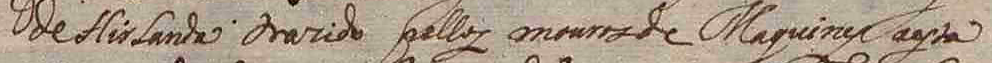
de Hirlanda trazido pellos mouros de Maguines a esta
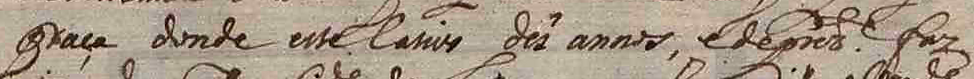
praça donde este Cativo dês annos, e de prez.te faz
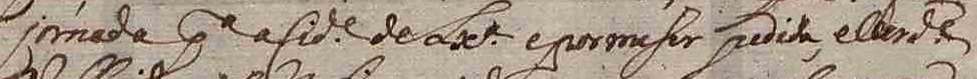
jornada pa a Cid.e de Lx.a e por me ser pedida, e verd.e
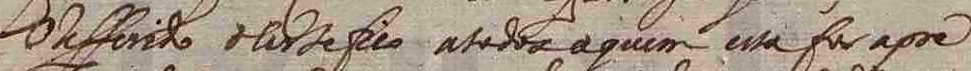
o Refferido o certefico a todos a quem esta for apre
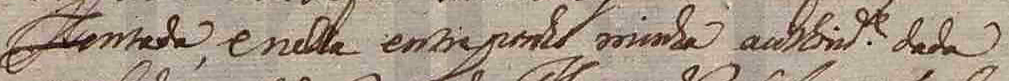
Zentada, e nella entraponho minha authorid.e dada
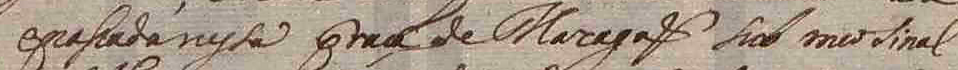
e passada nesta praça de Mazagaõ sob meo sinal
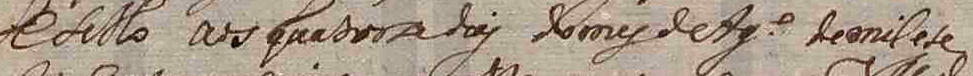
E sello aos quatorze dias do mes de Ag.o de mil e se
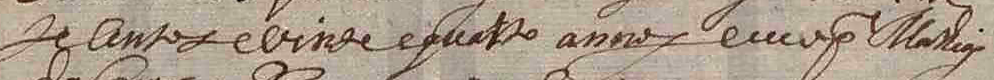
tecentos e vinte e quatro annos e eu o pe Mathias
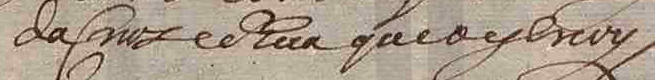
da Crus e Rua que o escrevy
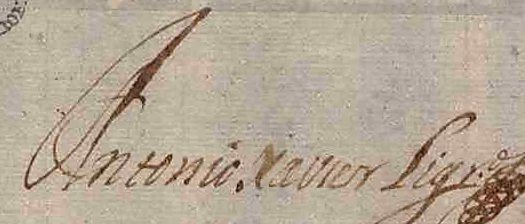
Antonio xavier Ligro
